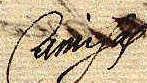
Camisas
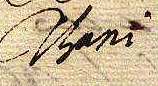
Thani
